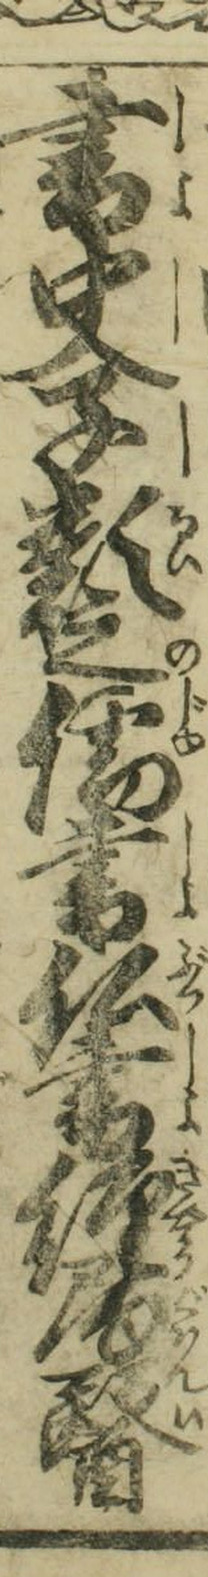書史子類之儒書仏書經巻醫
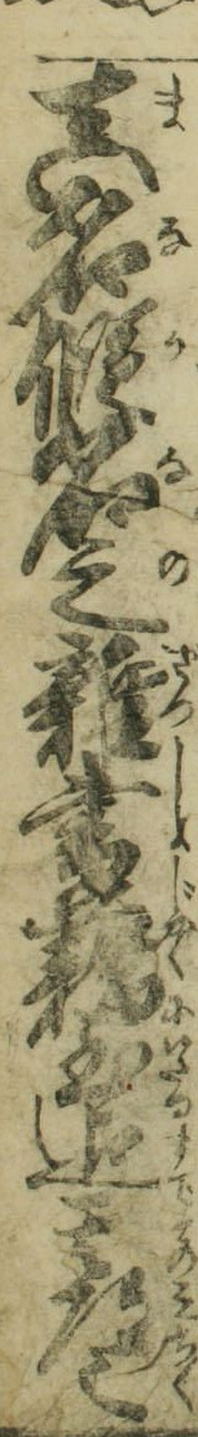真名假名之雑書籍至迄其道々

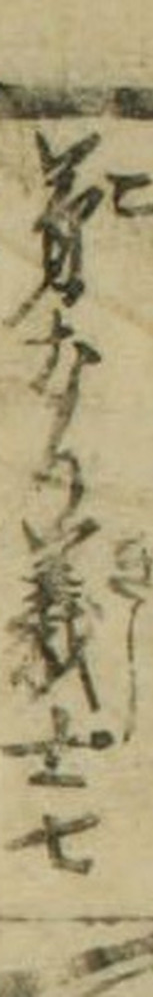弟なり義士七
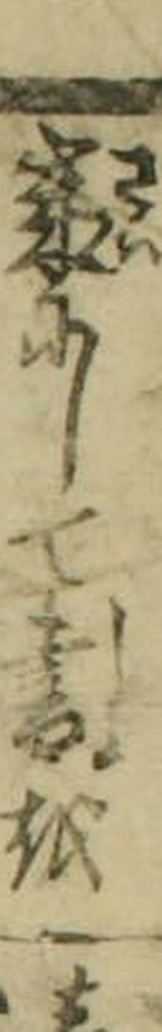歳にして書を
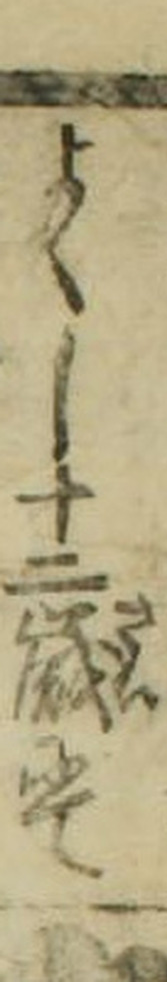よくし十三歳にて
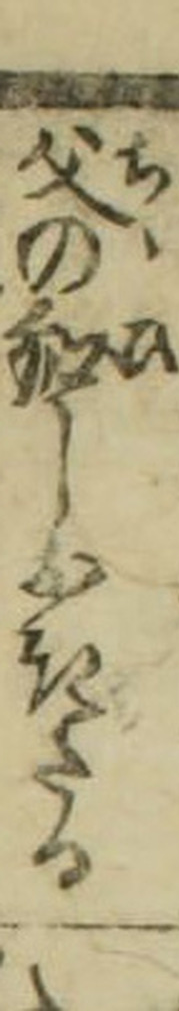父の秘しおきたる
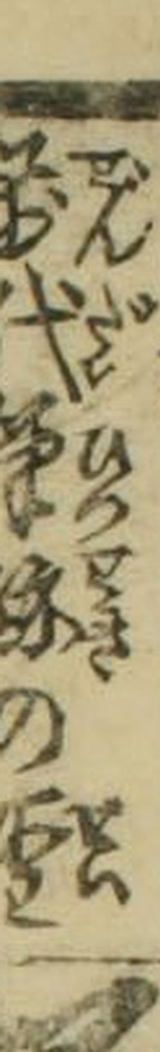前代筆跡の聖
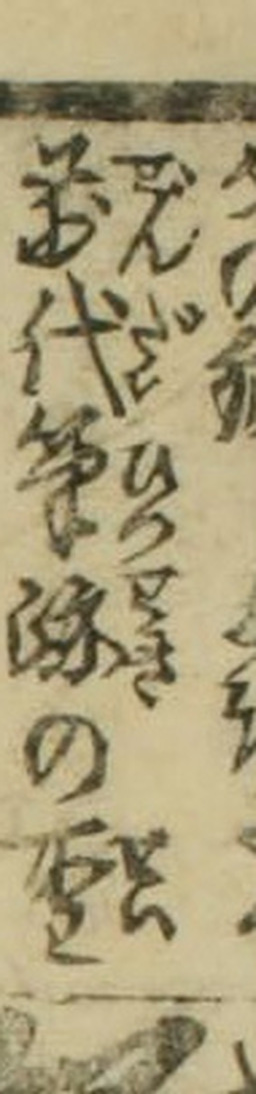前代筆跡の聖
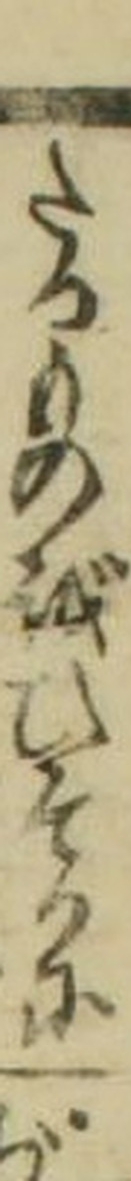たるものをひそかに
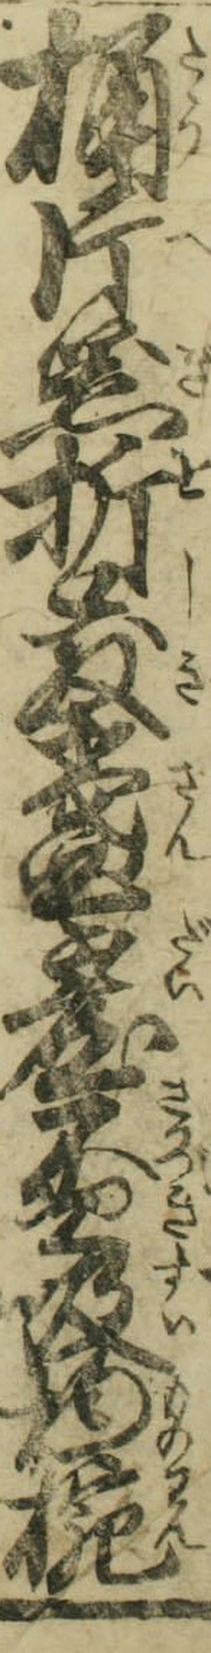桶片器折敷盞臺盃吸物椀
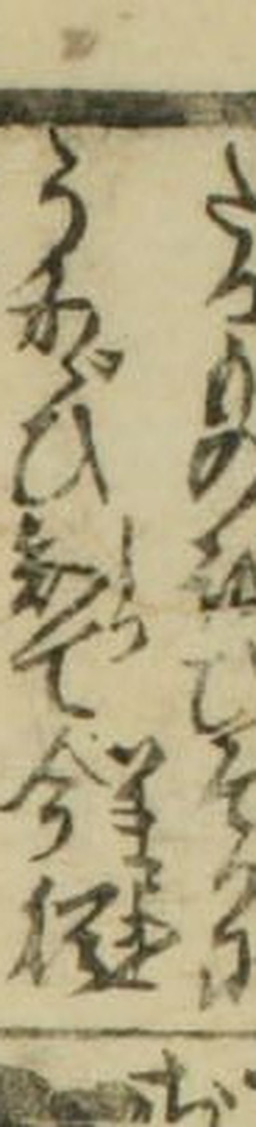うかゞひ知て今猶
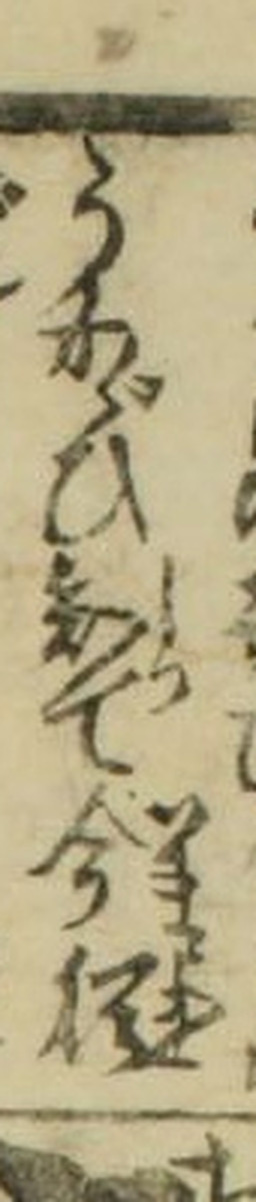うかゞひ知て今猶
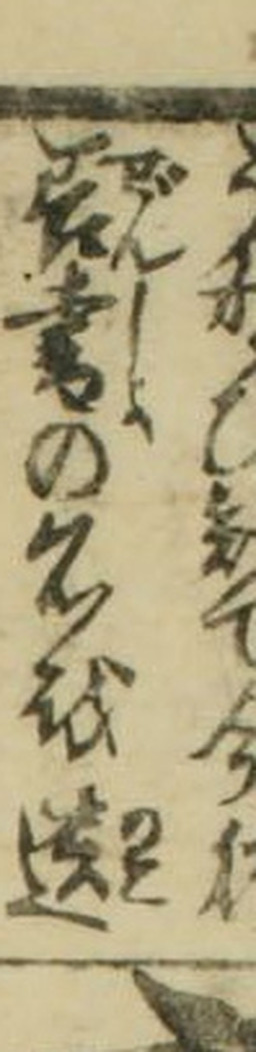善書の名を遺
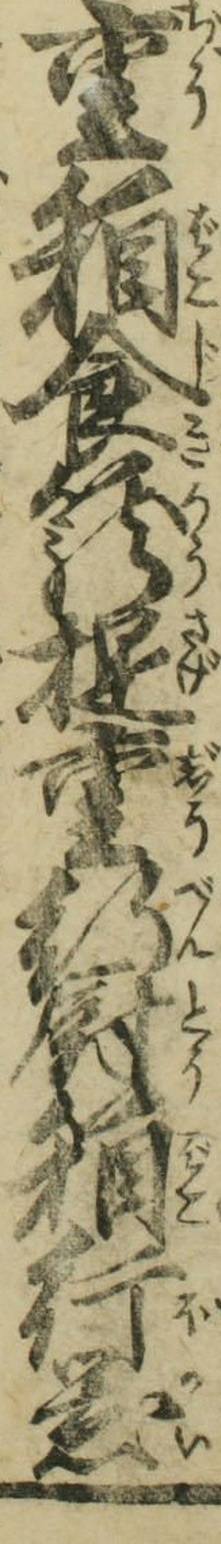重箱食籠提重行厨箱行器
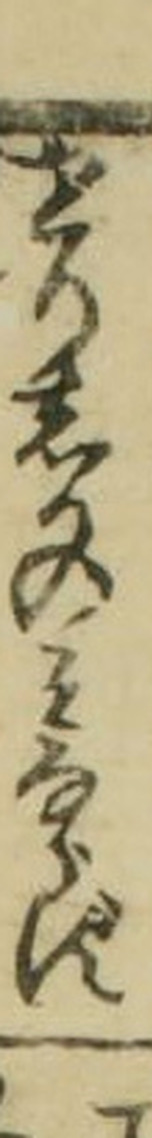せりしかのみならず
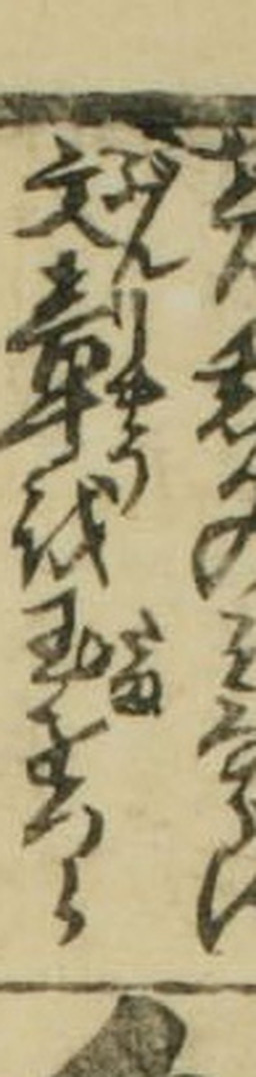文章を玉をつら
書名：増補職人往来
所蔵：東京学芸大学教育コンテンツアーカイブ
